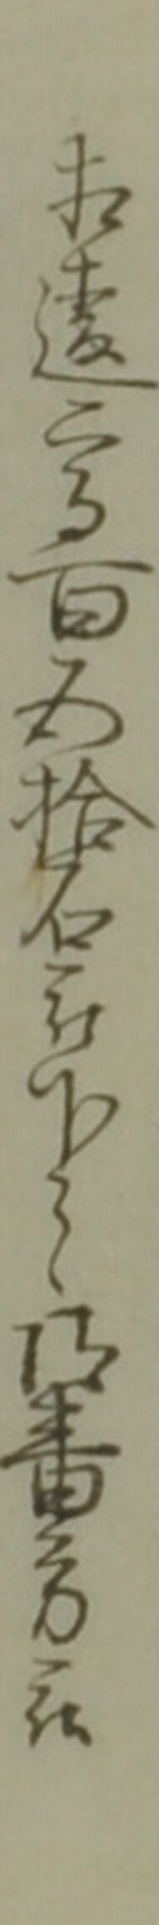相違高百五拾石被下之御番方被
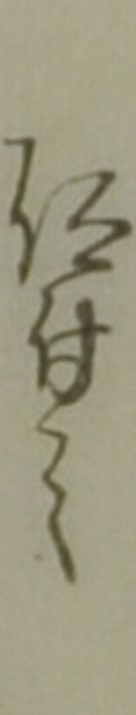仰付之
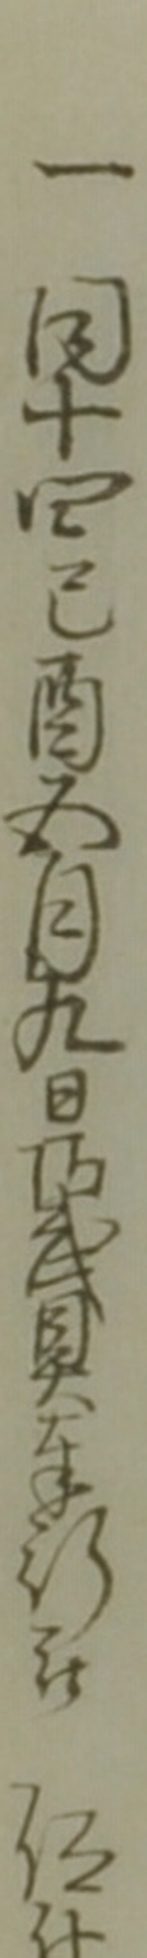一同十四己酉五月九日御武具奉行被仰付
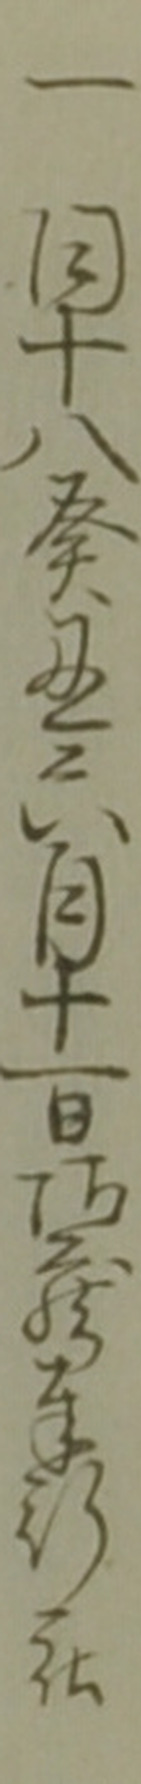一同十八癸丑六月十一日御蔵奉行被
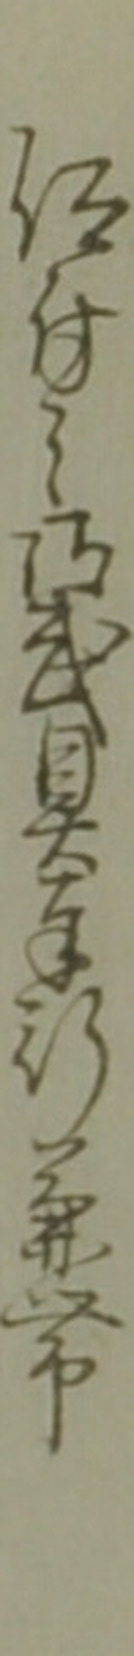仰付之御武具奉行兼帯
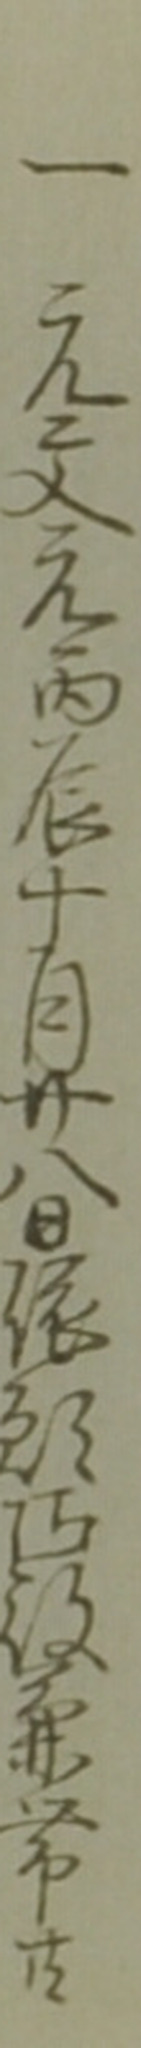一元文元丙辰十月廿八日依願御役兼帯共
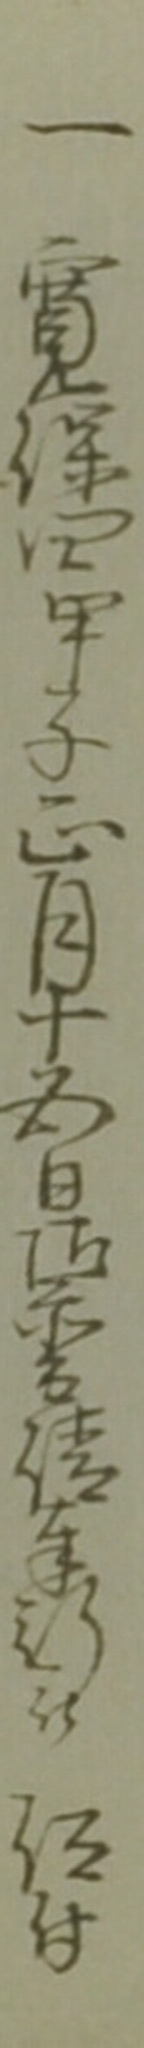一寛保四甲子正月十五日御普請奉行被仰付
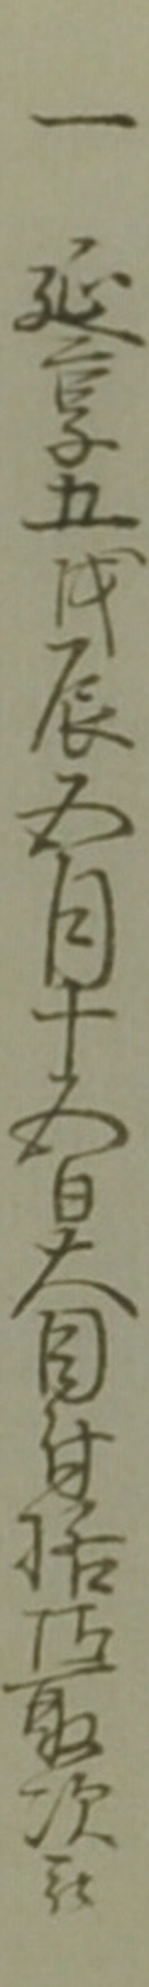一延享五戊辰五月十五日大目付格御取次被
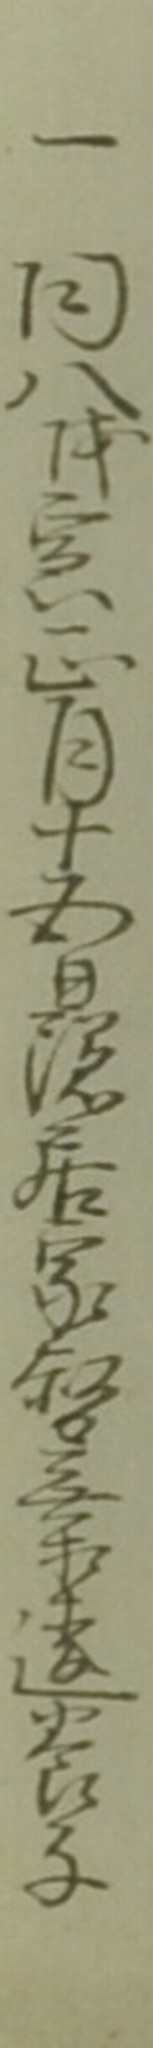一同七丁丑十二月十五日隠居家督無相違養子

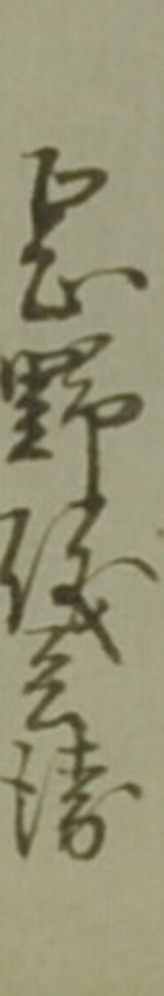岡野儀兵衛
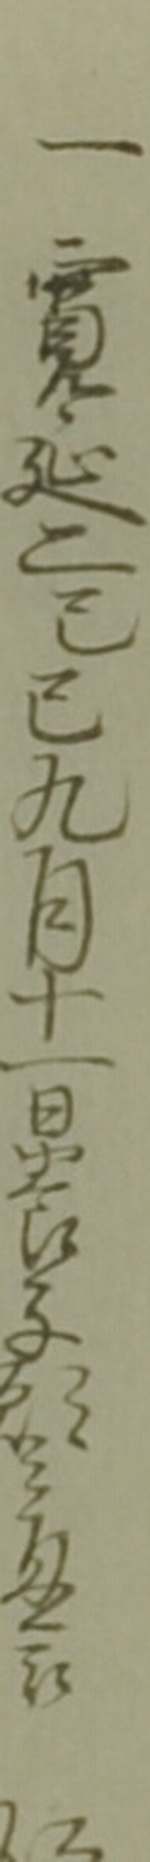一寛延二己巳九月十一日養子願之通被仰出
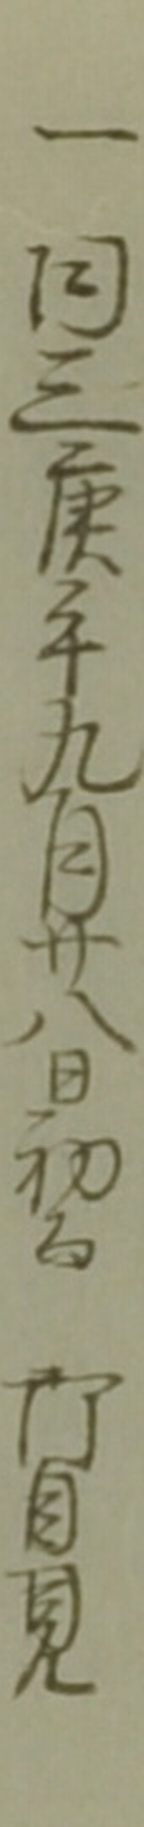一同三庚午九月廿八日初而御目見
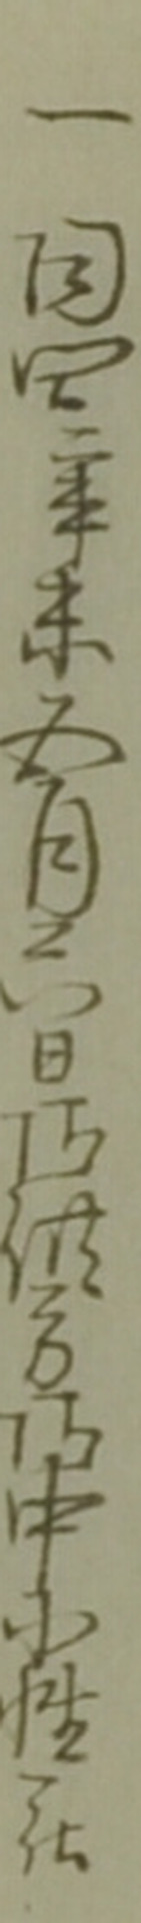一同四辛未五月六日御供方御中小性被
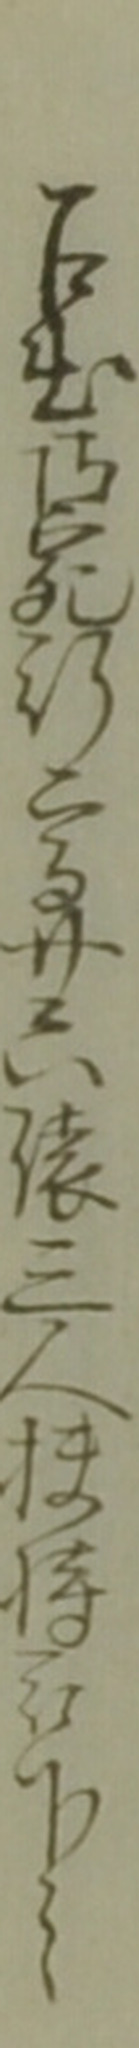召出御宛行高廿六俵三人扶持被下之
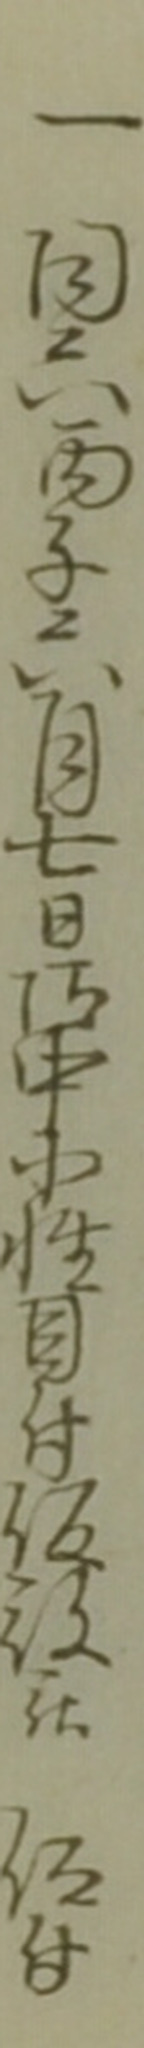一同六丙子六月七日御中小性目付仮役被仰付
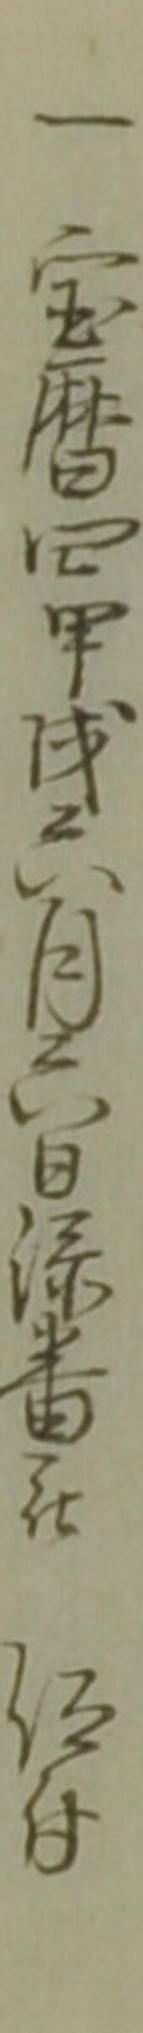一宝暦四甲戌六月六日添番被仰付
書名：給人諸士勤仕録（三）
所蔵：伊那市立高遠町図書館・合同会社AMANE
